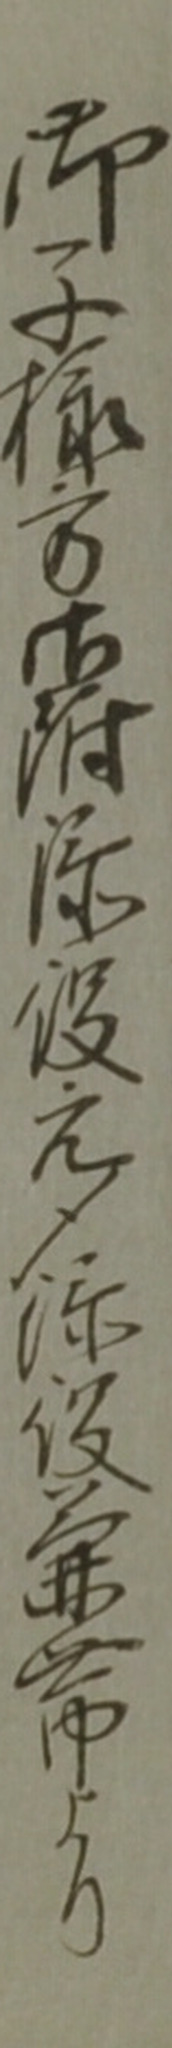御子様方御附添役元〆添役兼帯より
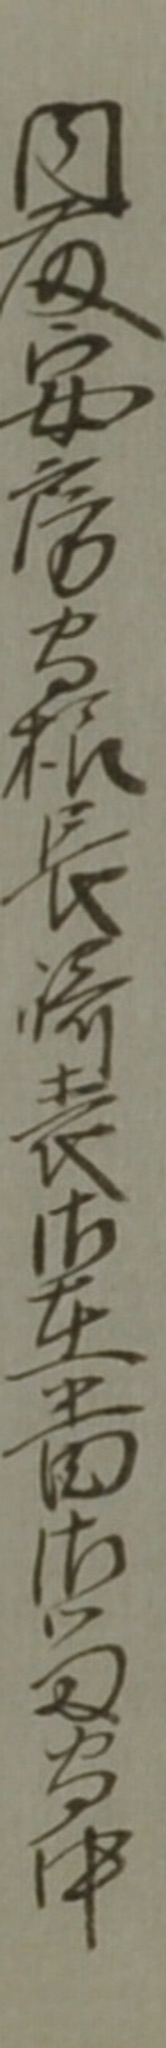内藤安房守様長崎表御在番御留守中
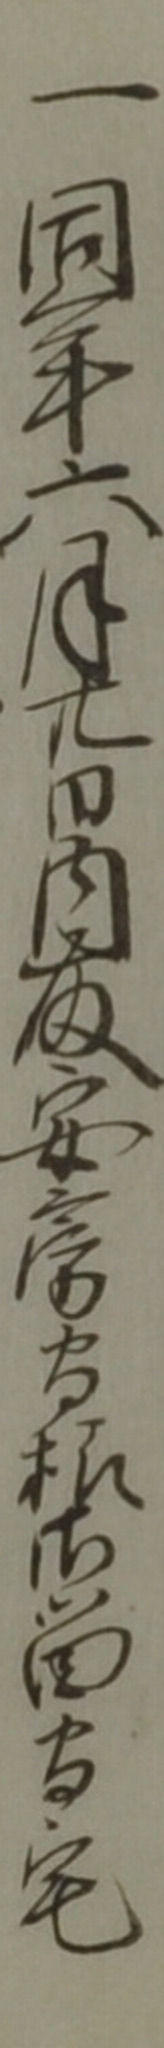一同年六月廿日内藤安房守様御留守宅
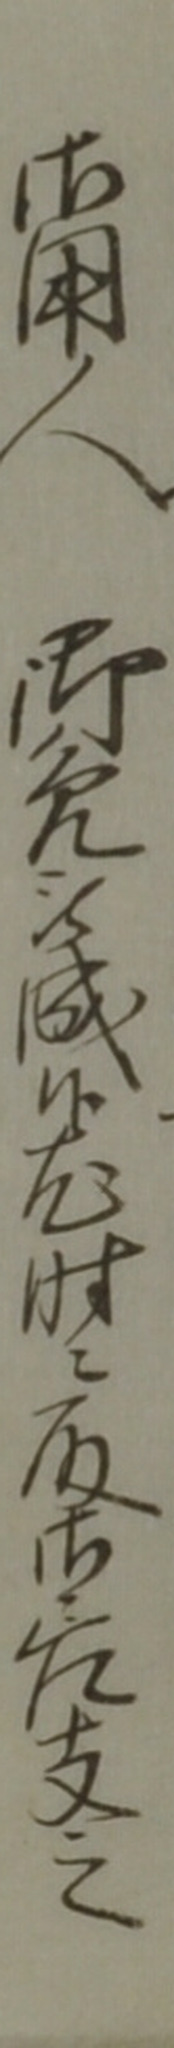御用人御免被成候尤時に殿御差支之
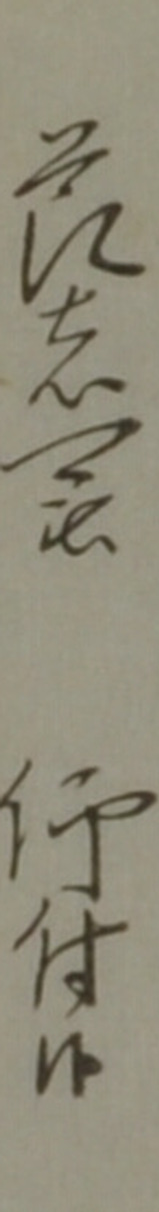節者可被仰付候
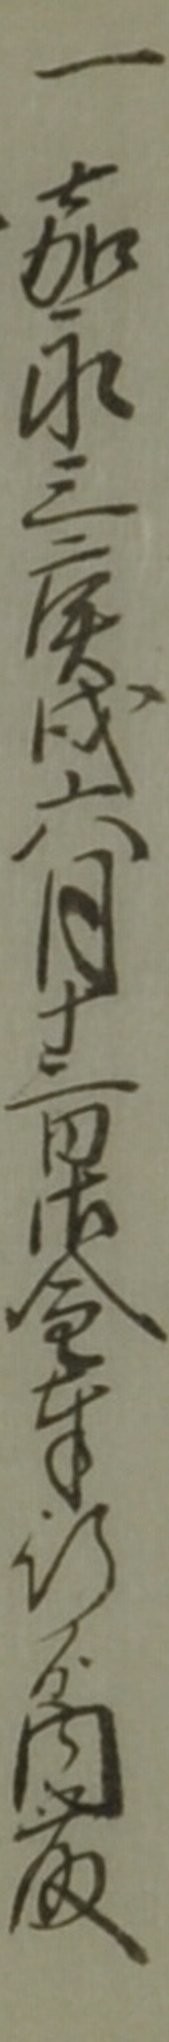一嘉永三庚戌六月十三日御金奉行より内藤
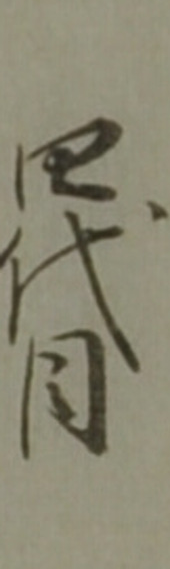四代目
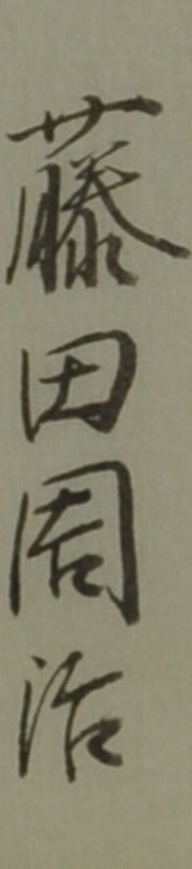藤田周治
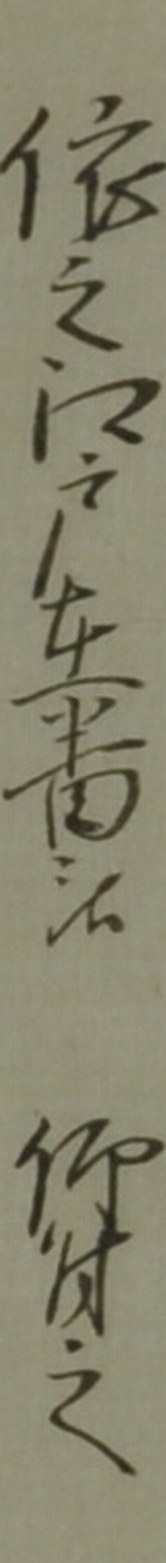依之江戸在番被仰付之
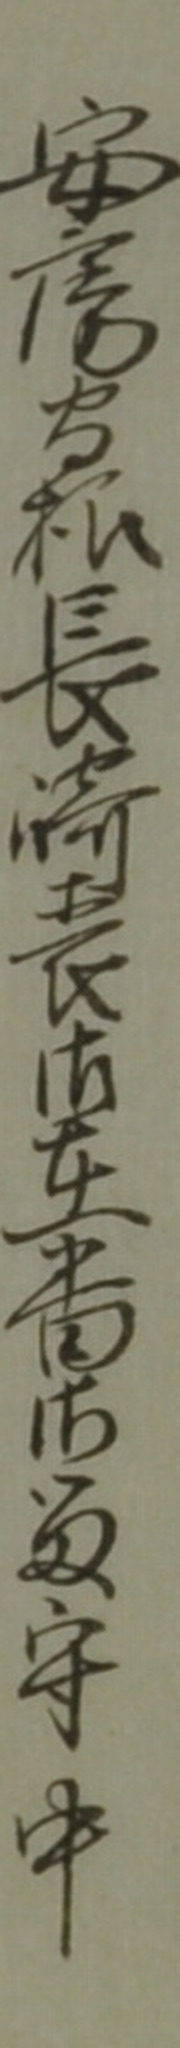安房守様長崎表御在番御留守中
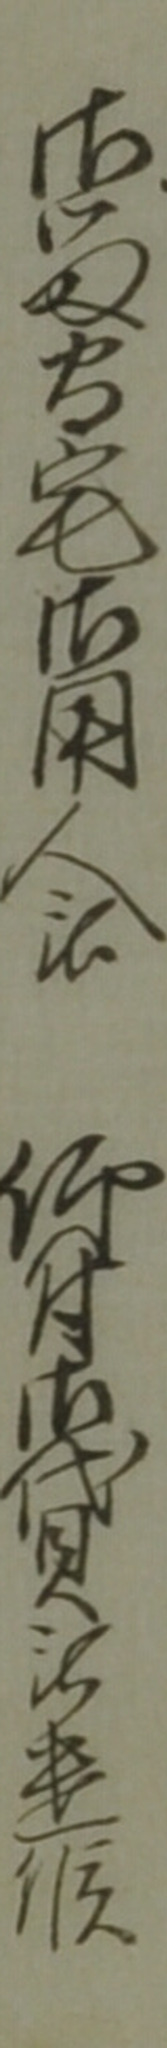御留守宅御用人被仰付御貸被遣候
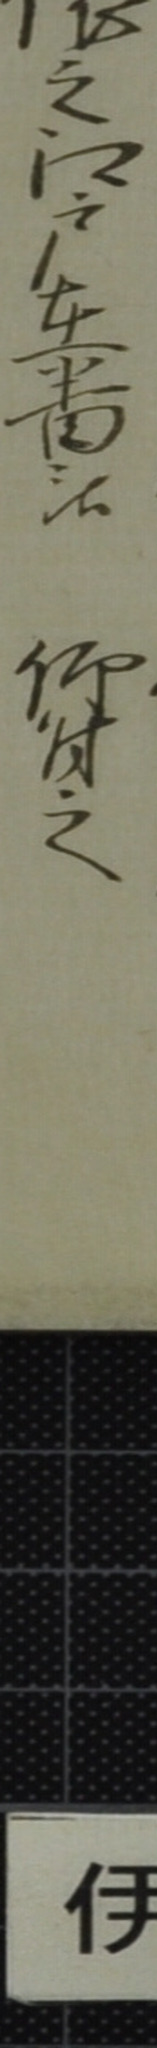依之江戸在番被仰付之

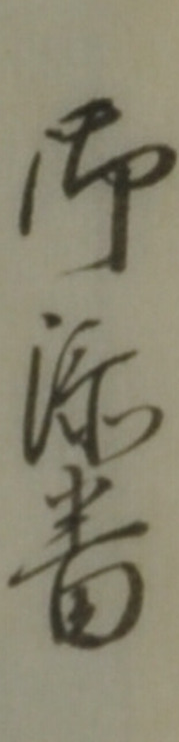御添番
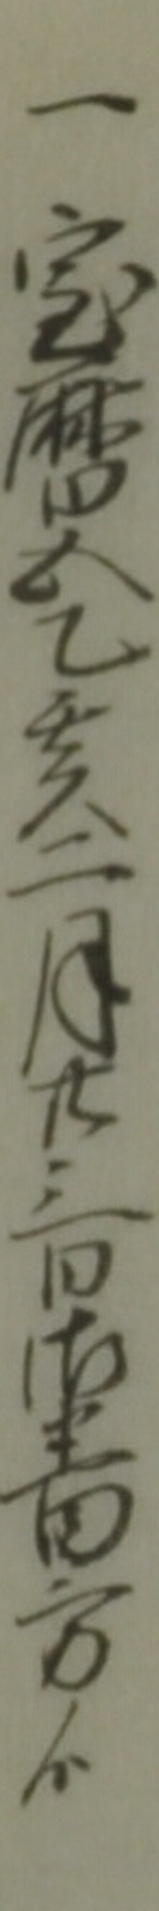一宝暦五乙亥二月廿三日御番方より
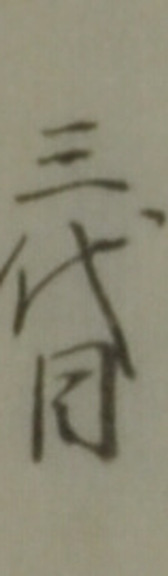三代目
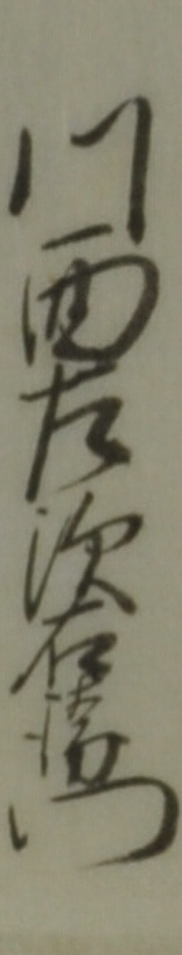川西左次右衛門
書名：諸御役代々録（八）
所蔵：伊那市立高遠町図書館・合同会社AMANE
